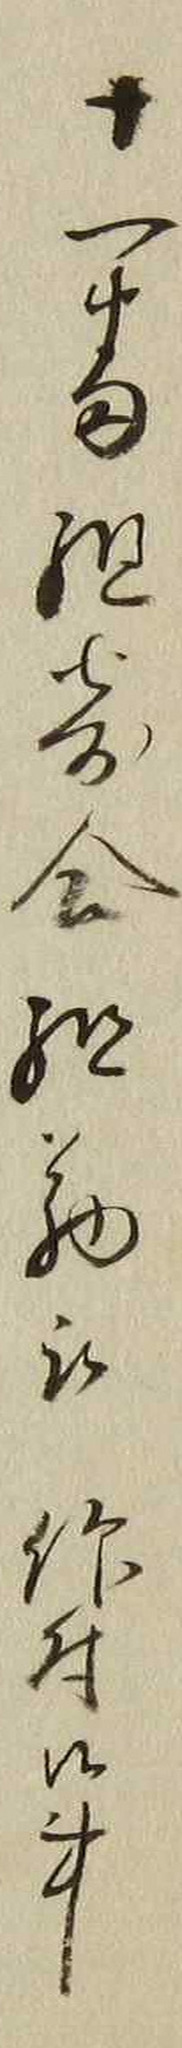十一番組寄合組勤被仰付候事
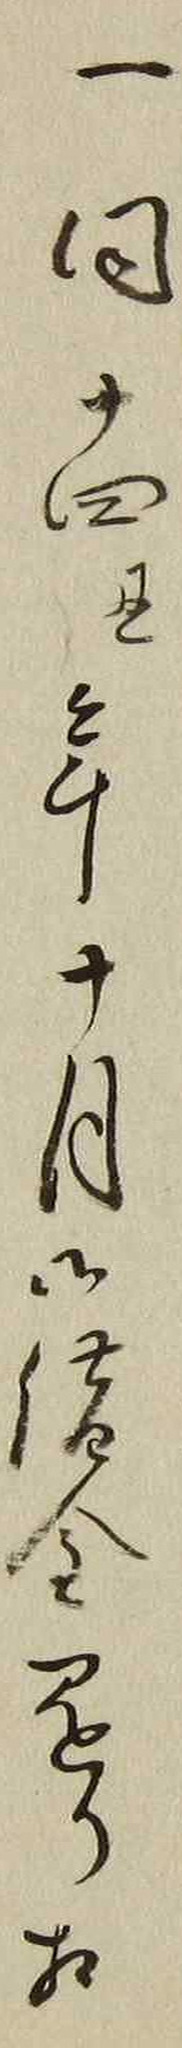一同十四丑年十月御借金懸り相
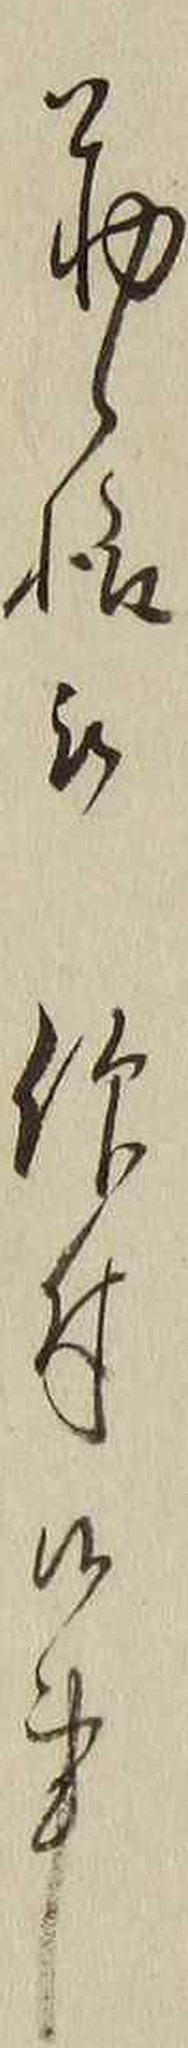勤候様被仰付候事
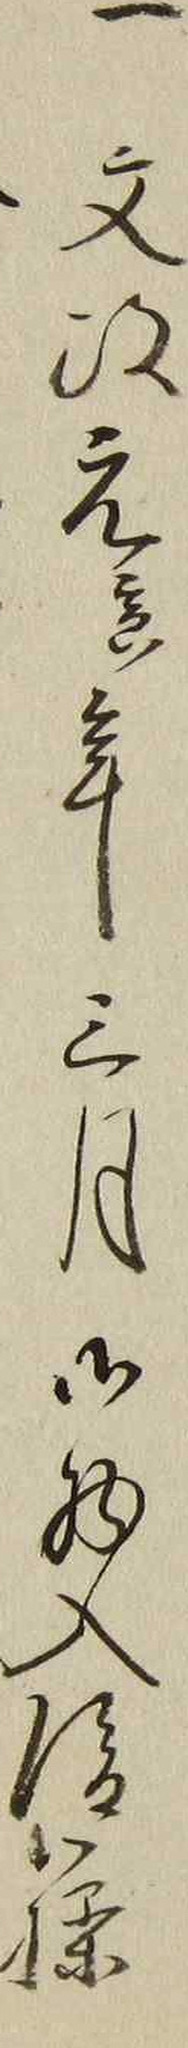一文政元寅年三月御物入後御操
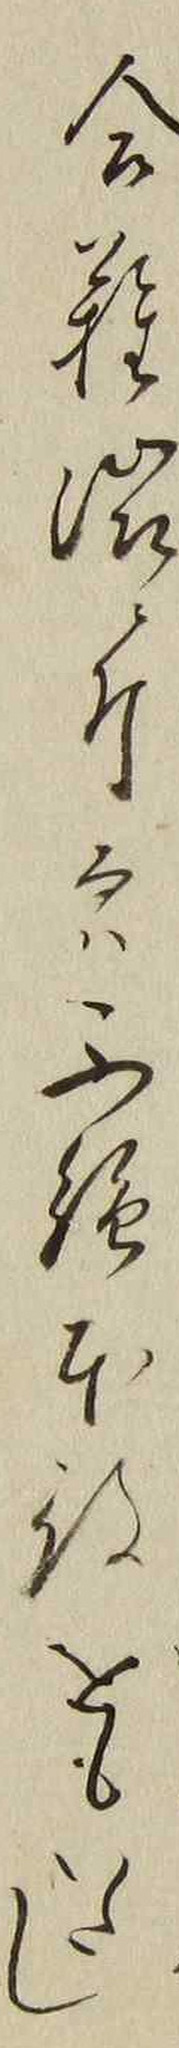合難渋ニ付而ハ不絶本役をもいたし
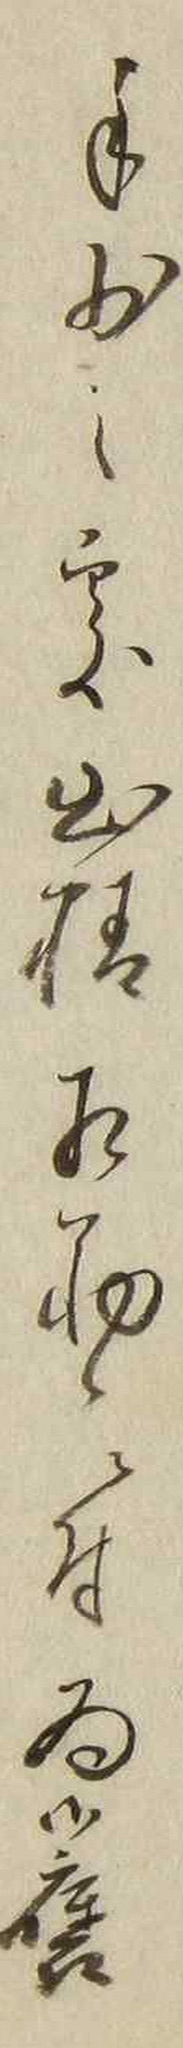手少之所出精相勤候ニ付為御褒
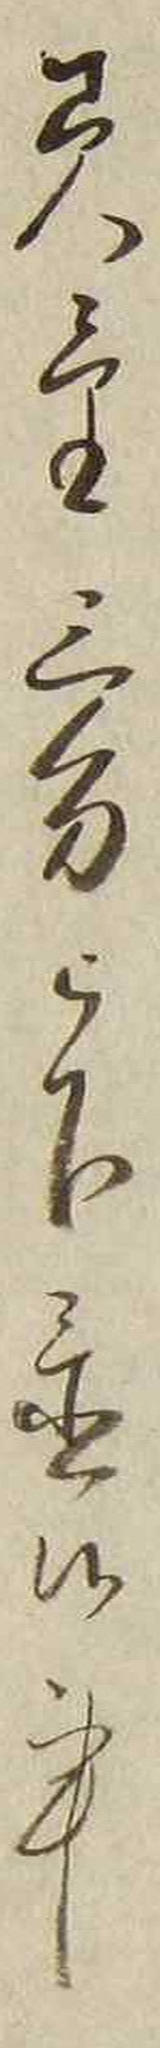美金三分被下置候事

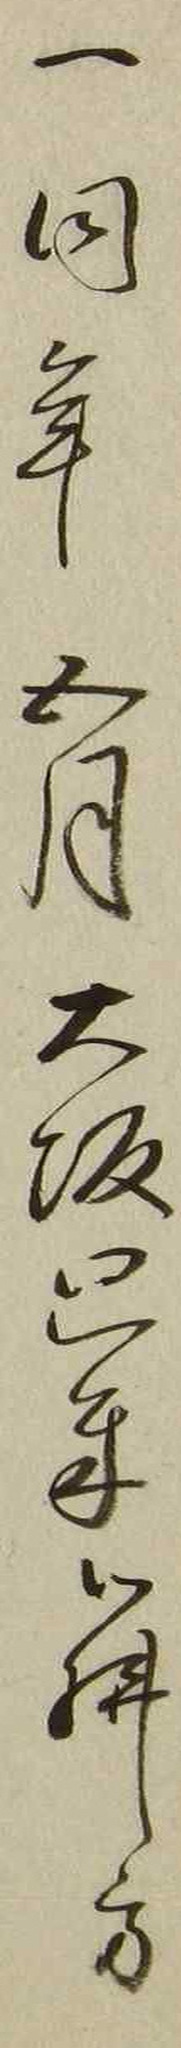一同年五月大坂廻米御払方
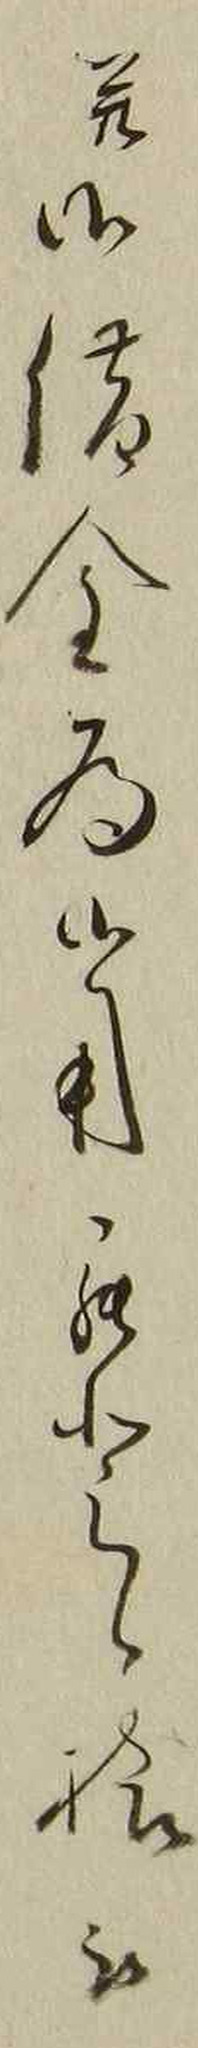并御借金為御用罷登候様被
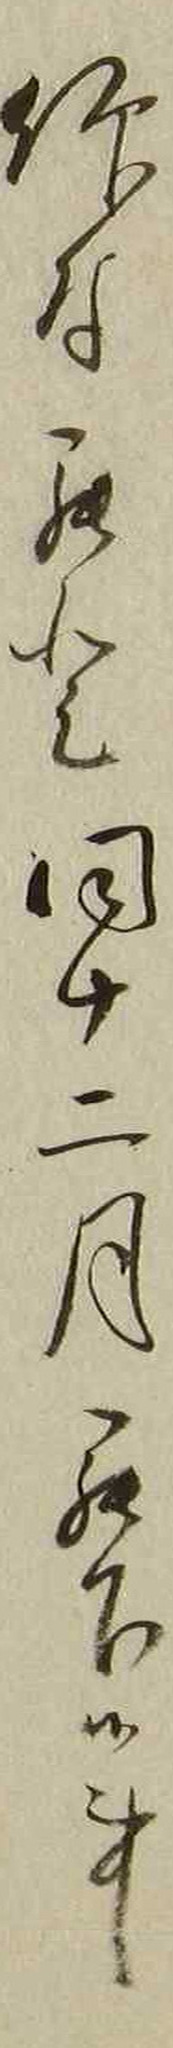仰付罷登同十二月罷下候事
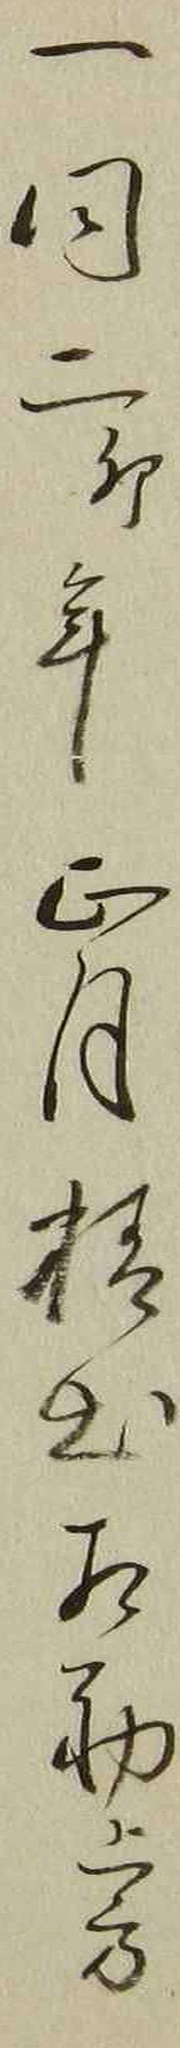一同二卯年正月精出相勤上方
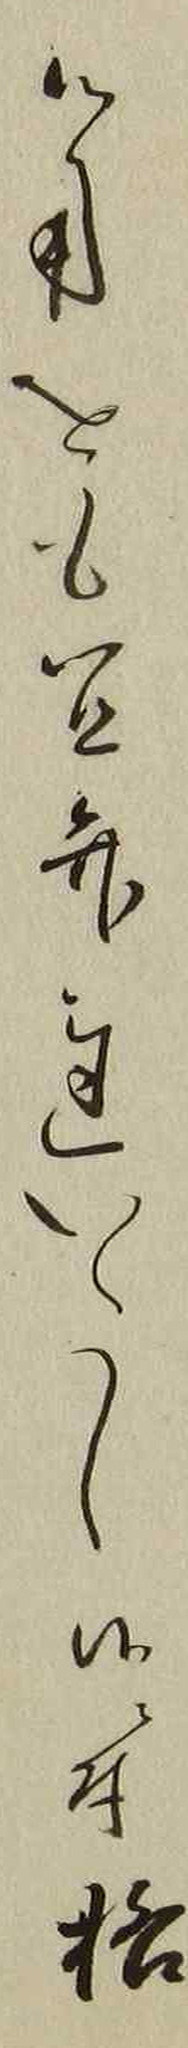御用をも宜弁達いたし候ニ付格
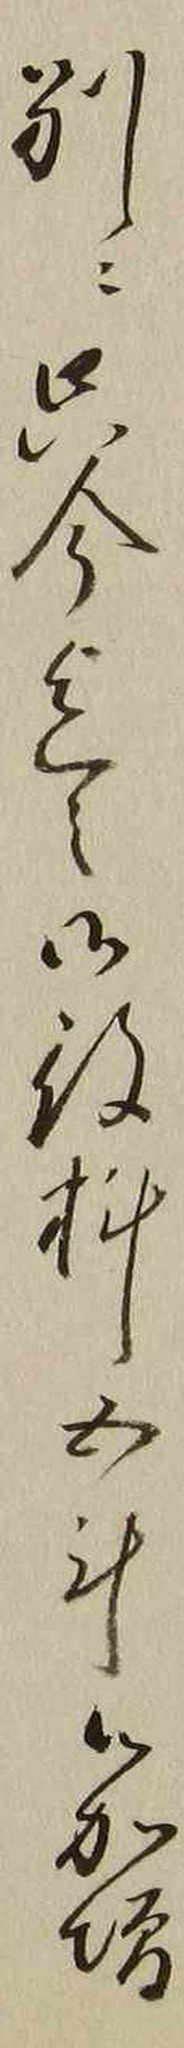別ニ只今迄之御役料五斗御加増
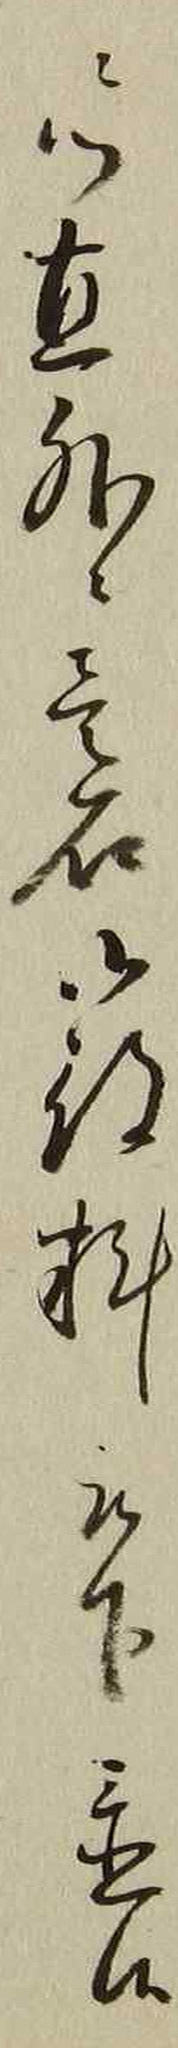ニ御直外ニ壱石御役料被下置候
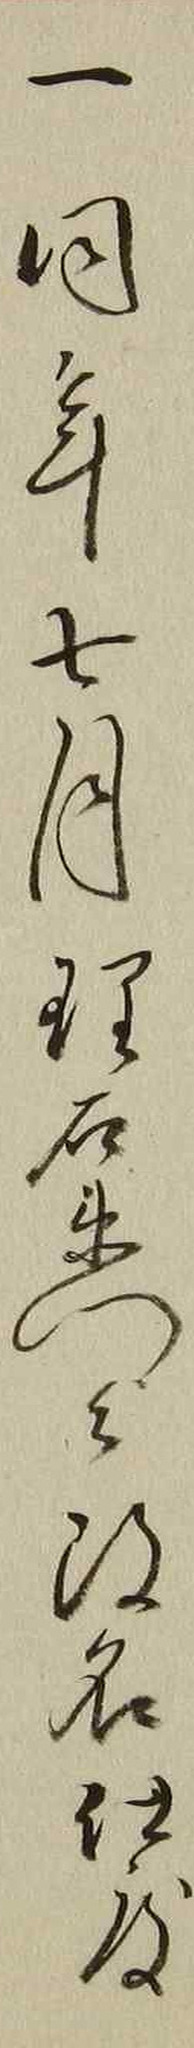一同年七月理石衛門と改名仕度
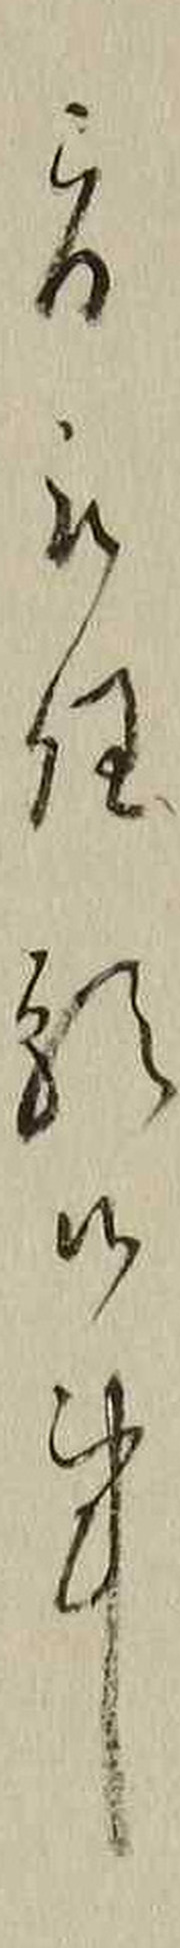旨被任願候事
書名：諸士系譜　巻之132　た之部8
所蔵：会津若松市立会津図書館
